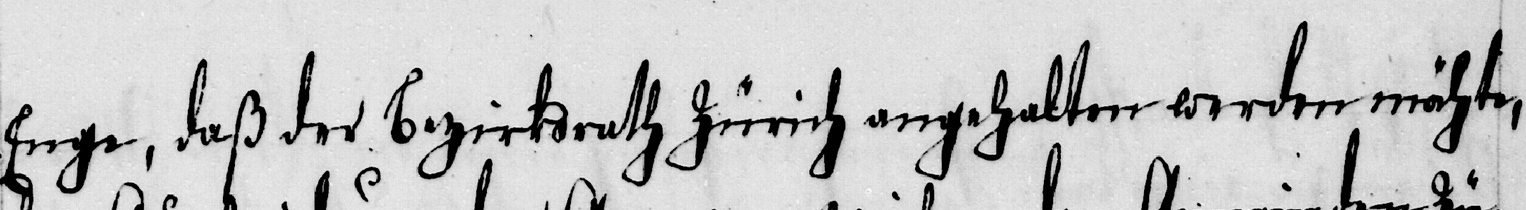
Enge, daß der Bezirksrath Zürich angehalten werden möchte,
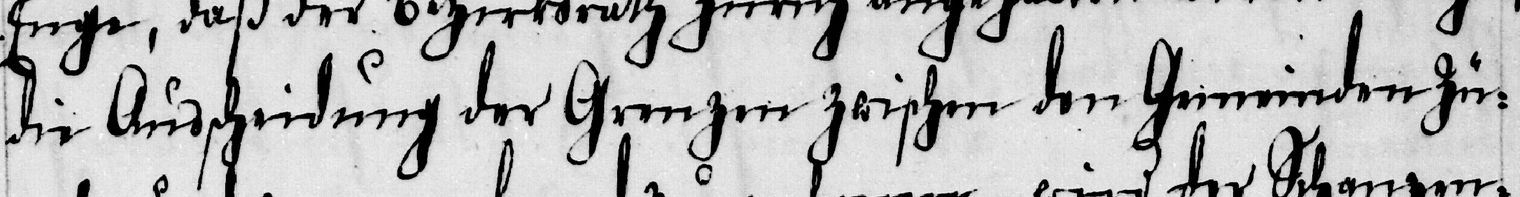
die Ausscheidung der Grenzen zwischen den Gemeinden Zü¬
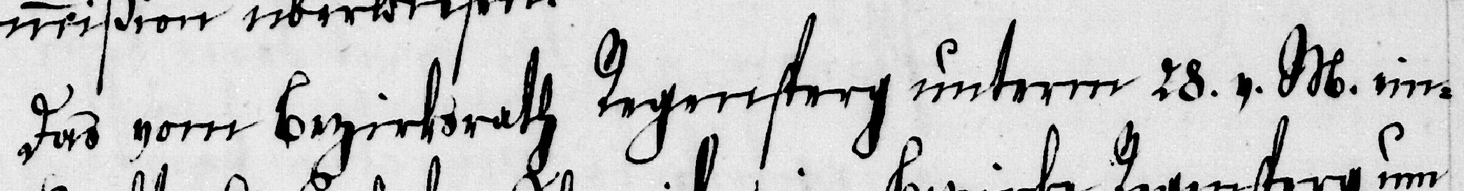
Das vom Bezirksrath Regensperg unterm 28. v. M. ein¬
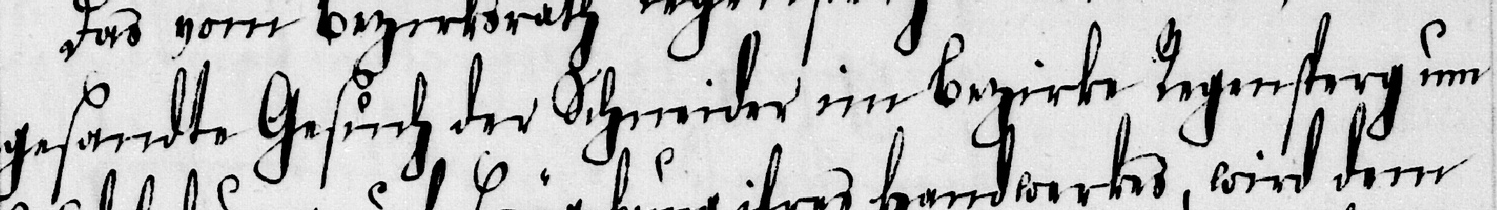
gesandte Gesuch der Schneider im Bezirke Regensperg um
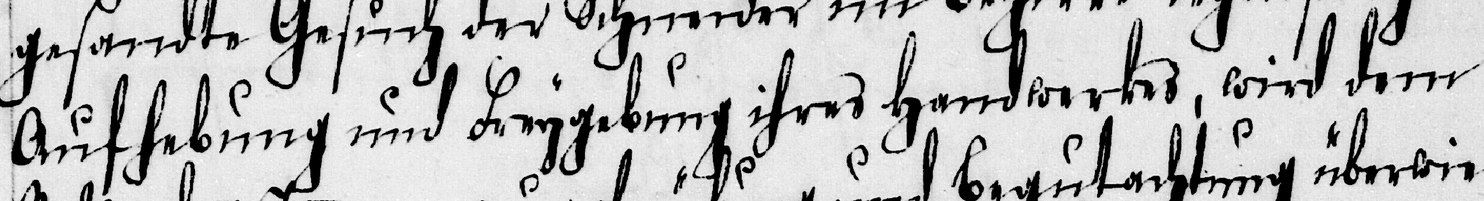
Aufhebung und Freygebung ihres Handwerkes, wird dem
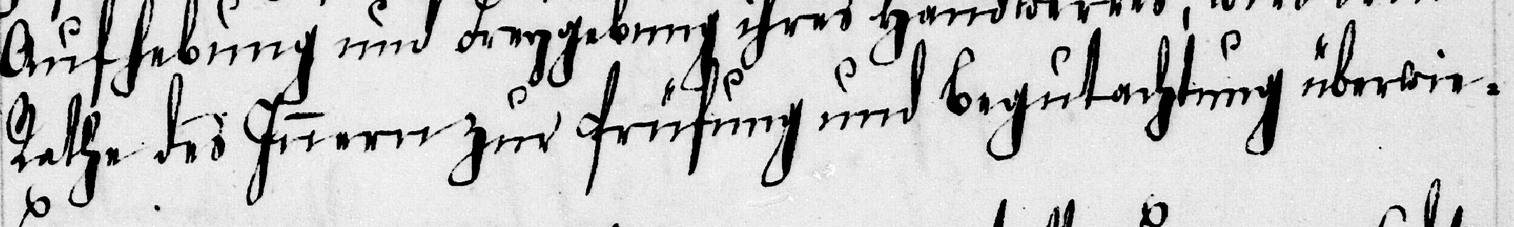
Rathe des Innern zur Prüfung und Begutachtung überwie¬
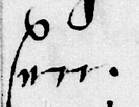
sen.
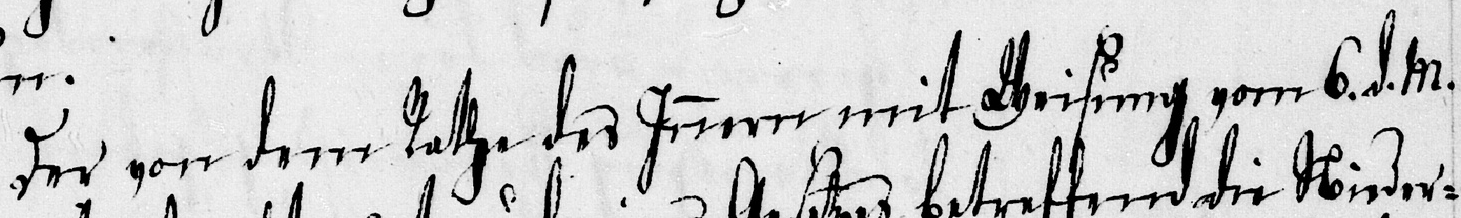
Der von dem Rathe des Innern mit Weisung vom 6. d. M.
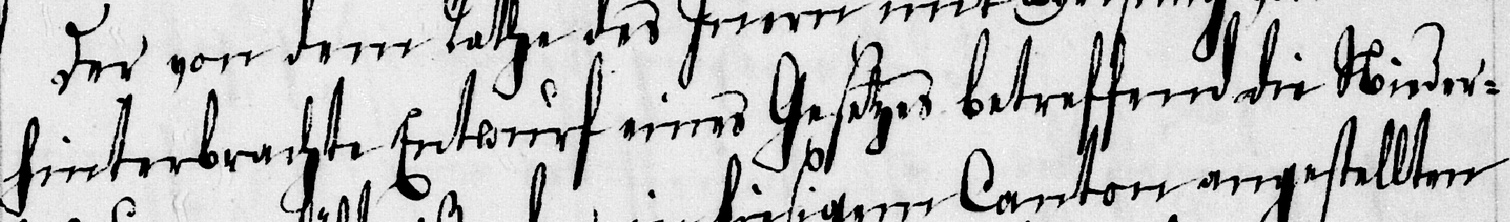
hinterbrachte Entwurf eines Gesetzes betreffend die Nieder¬
